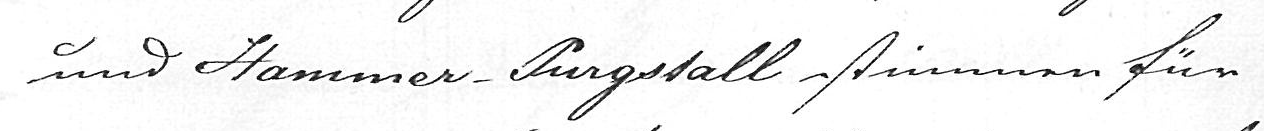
und Hammer-Purgstall stimmen für
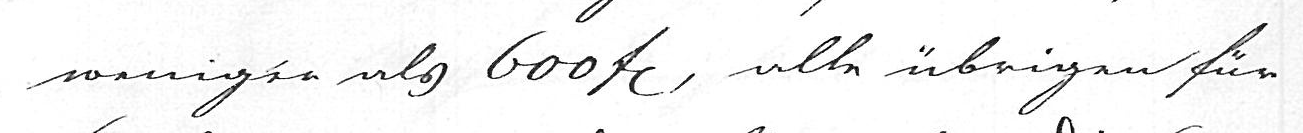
weniger als 600 fl, alle übrigen für
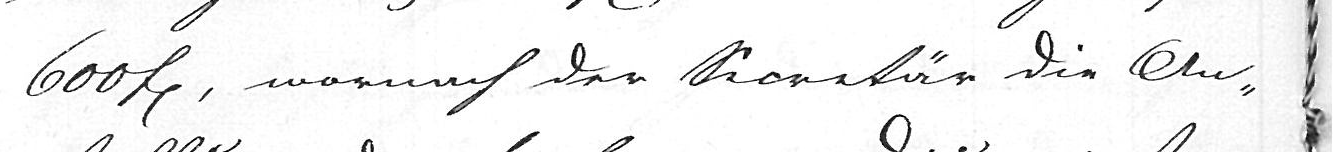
600 fl, wornach der Secretär die An-
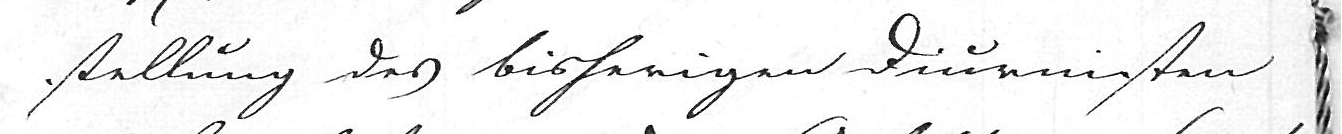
stellung des bisherigen Diurnisten
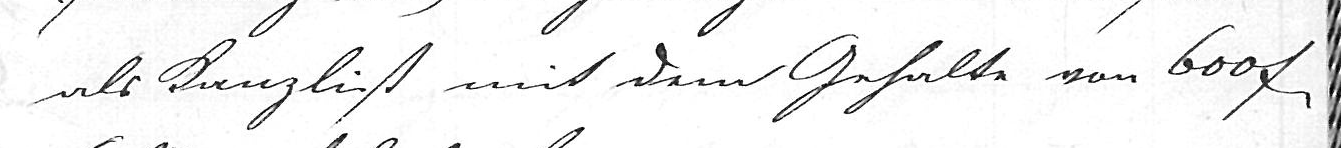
als Kanzlist mit dem Gehalte von 600 fl
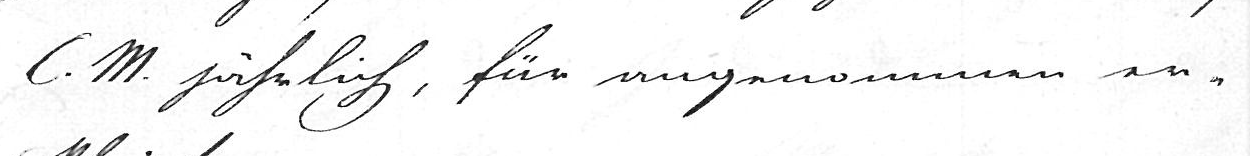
C. M. jährlich, für angenommen er-
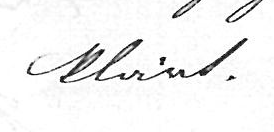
klärt.
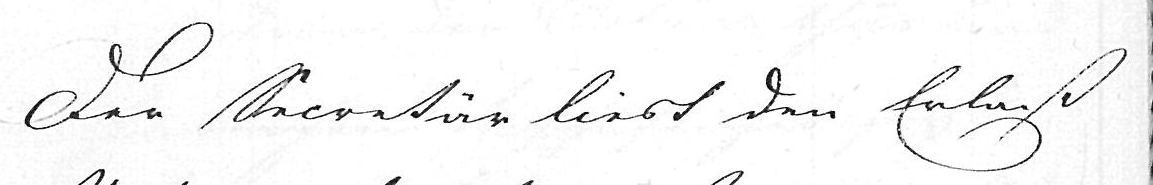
Der Secretär liest den Erlaß
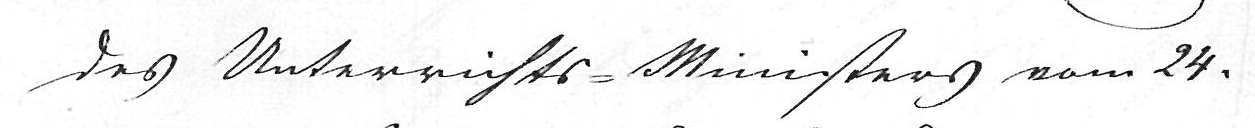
des Unterrichts-Ministers vom 24.
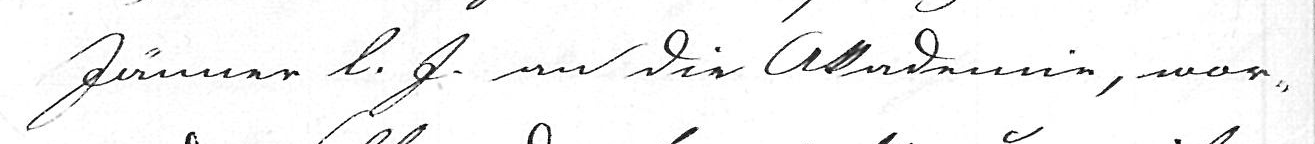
Jänner l. J. an die Akademie, wor
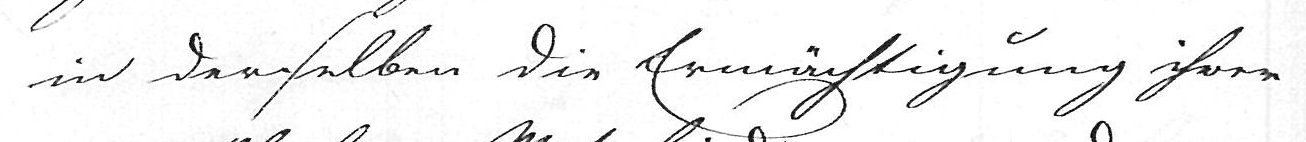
in derselben die Ermächtigung ihrer
